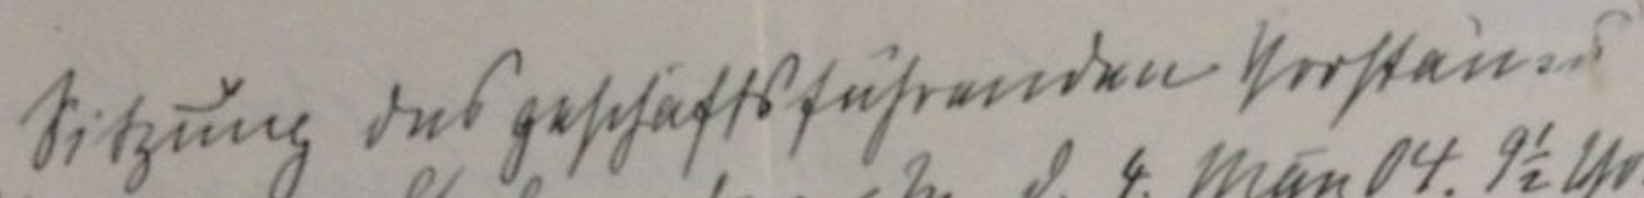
Sitzung des geschäftsführenden Vorstands
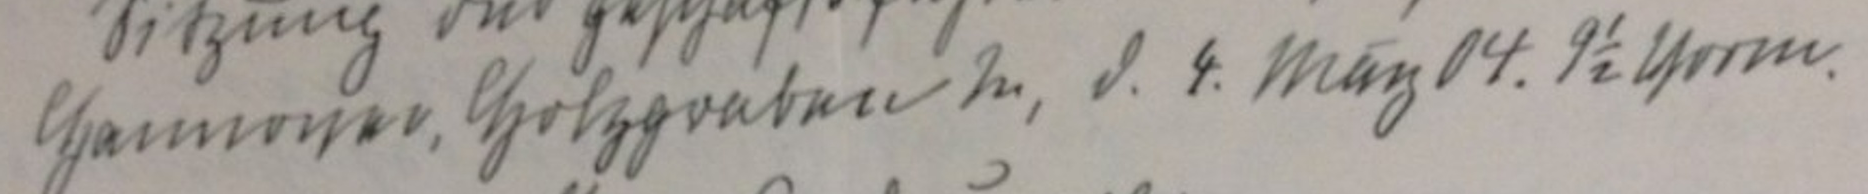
Hannover, Holzgraben 9, d. 4. März 04 9½ Vorm.
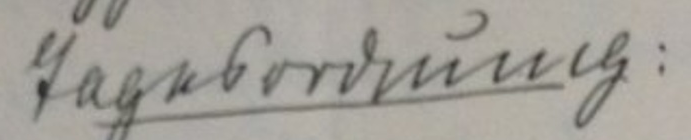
Tagesordnung:
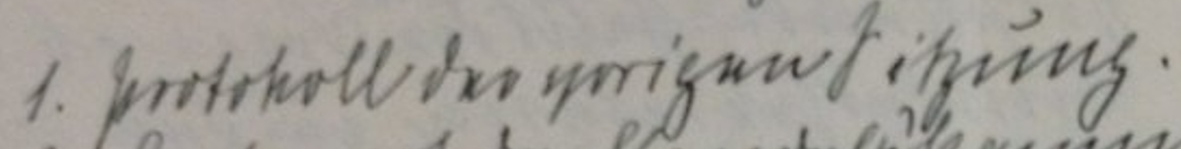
1. Protokoll der vorigen Sitzung
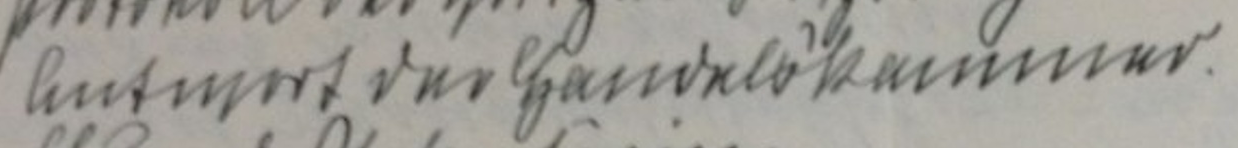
2. Antwort der Handelskammer
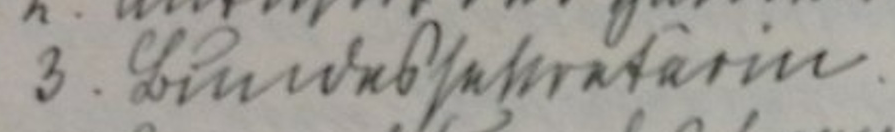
3. Bundessekretärin
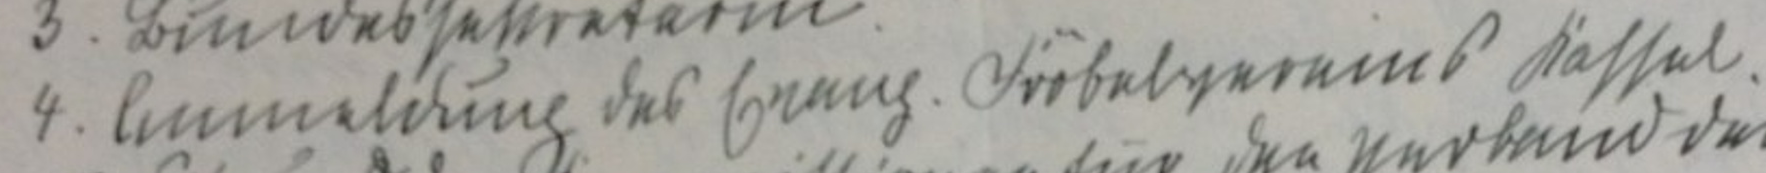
4. Anmeldung des Evang. Bibelvereins Kassel
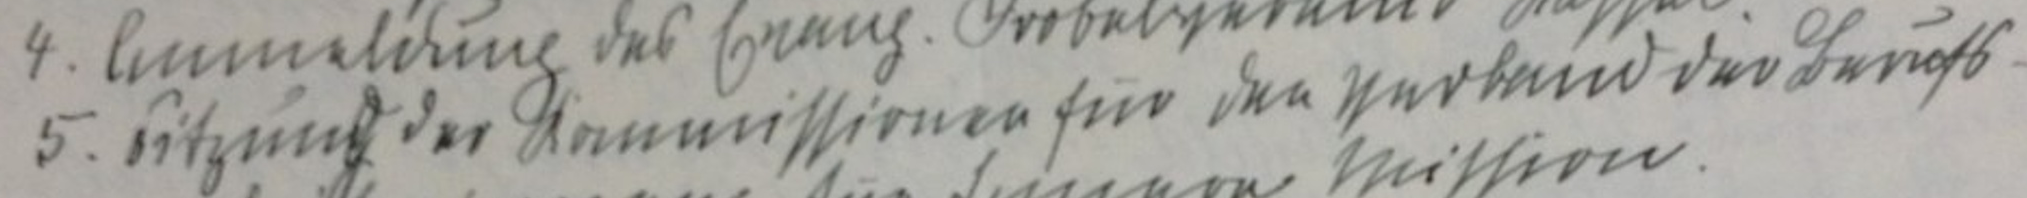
5. Sitzung der Kommissionen für die Vorstand der Berufs
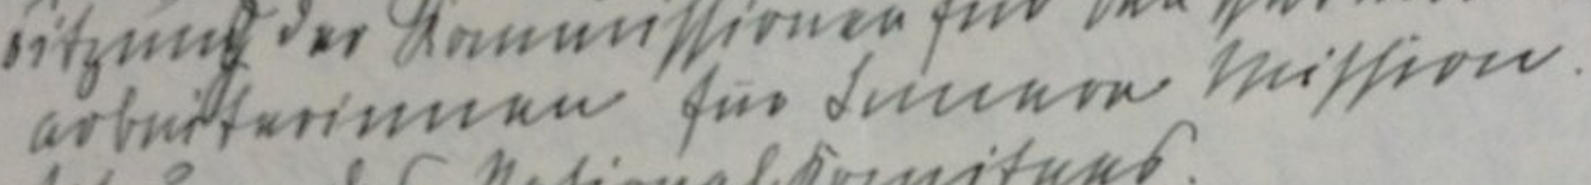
arbeiterinnen für Innere Mission
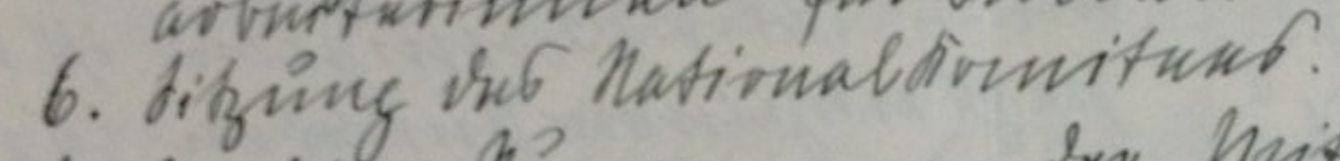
6. Sitzung des Nationalkomitees
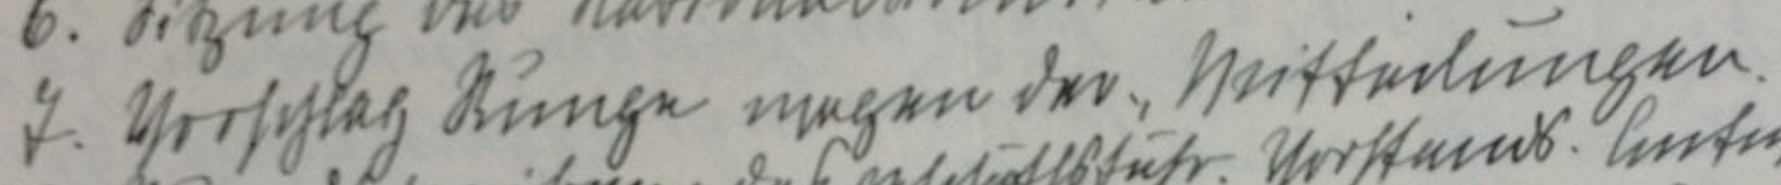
7. Vorschlag Runge wegen der „Mitteilungen"
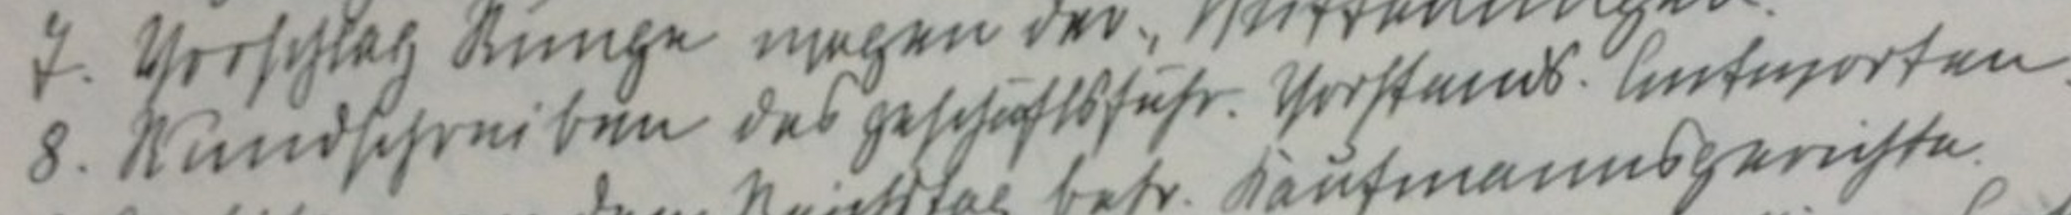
8. Rundschrewiben des geschäftführ. Vorstand Antworten
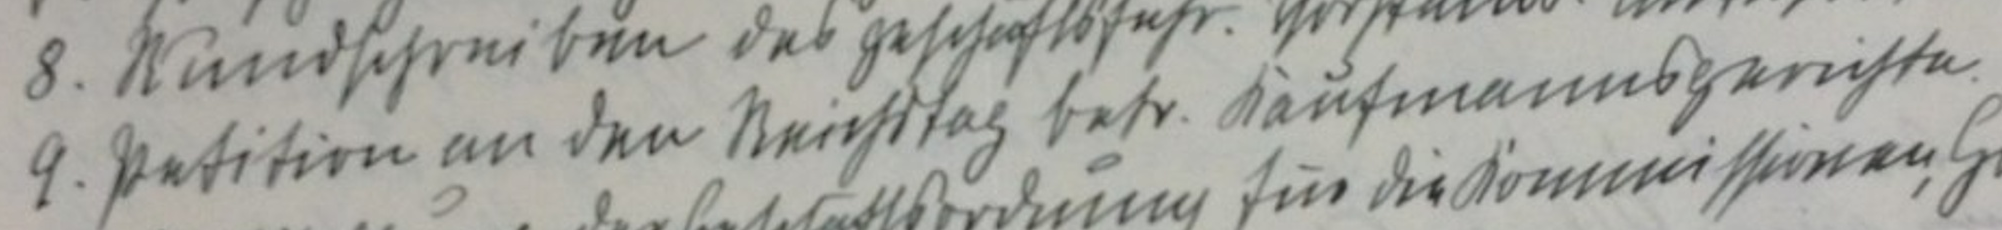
9. Petition an den Reichstag betr. Kaufmannsgerichte
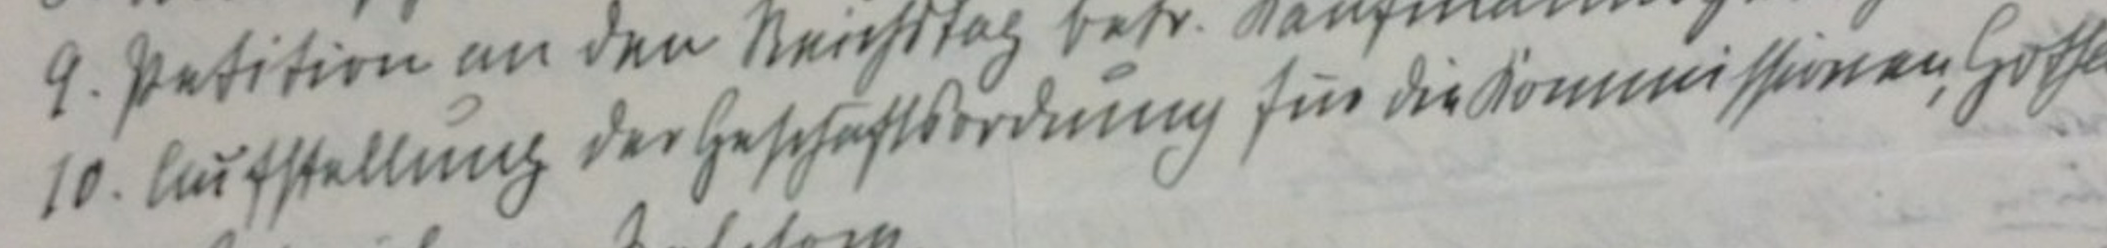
10. Aufstellung der Geschäftsordnung für die kommissionen, Gotha
